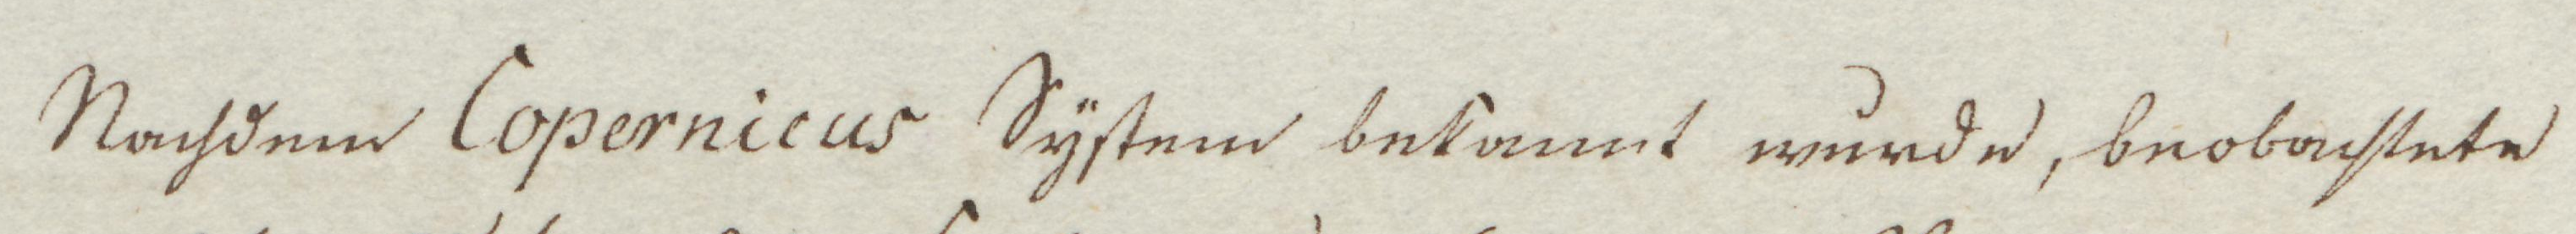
Nachdem Copernicus Sÿstem bekannt wurde, beobachtete
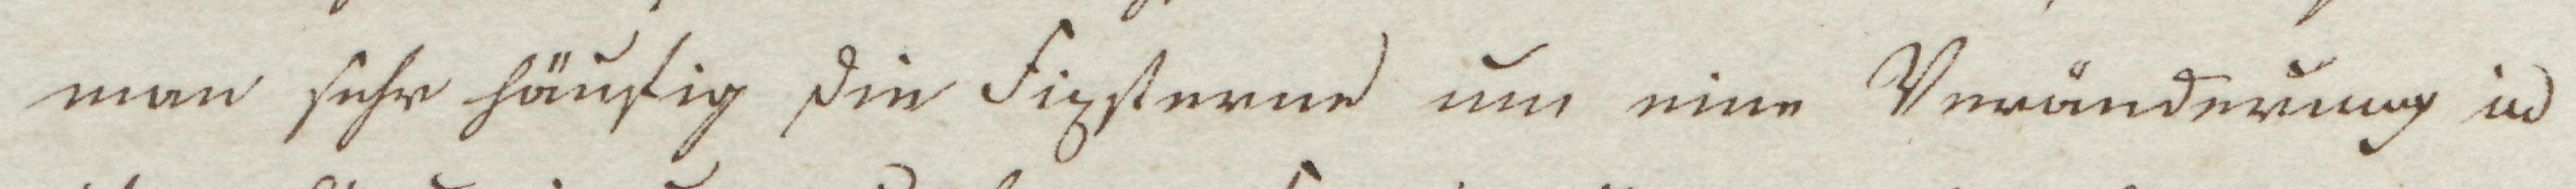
man sehr häufig die Fixsterne um eine Veränderung in
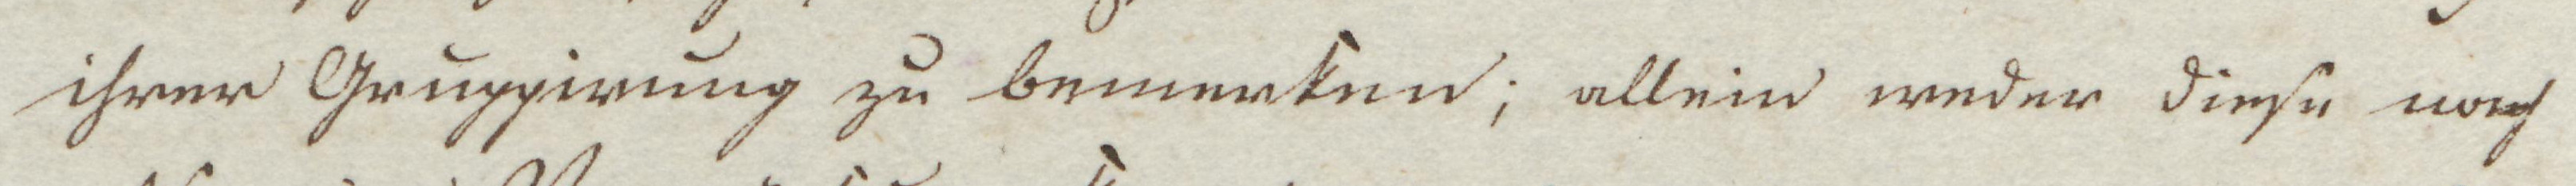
ihrer Gruppirung zu bemerken; allein weder diese noch
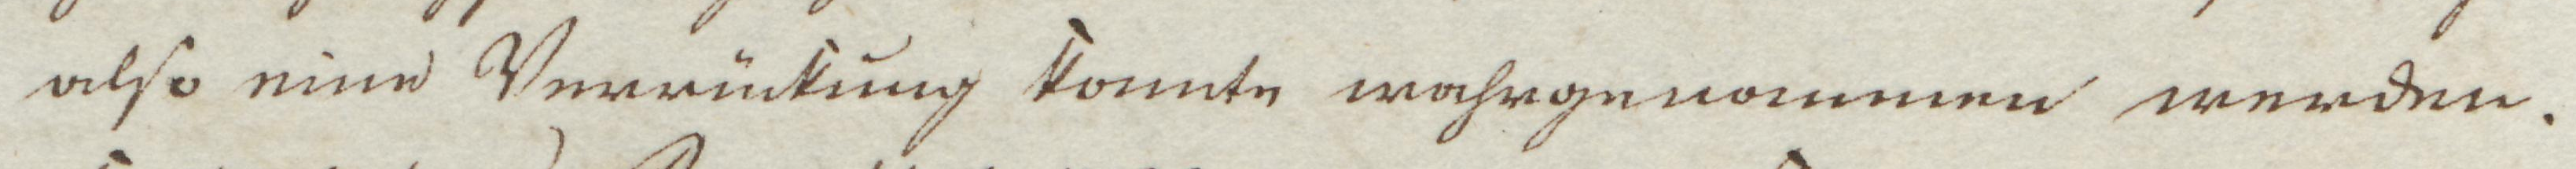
also eine Verrückung konnte wahrgenommen werden.
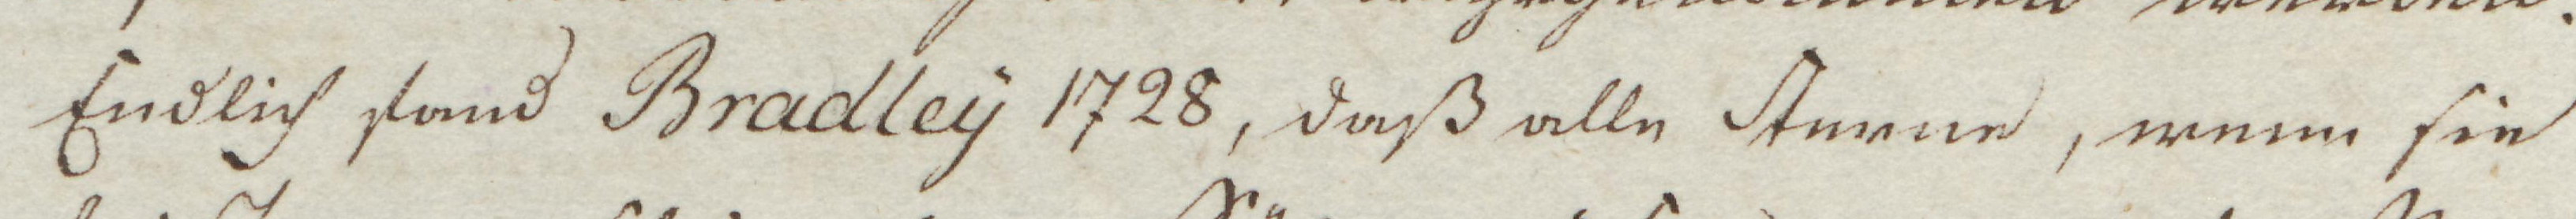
Endlich fand Bradleÿ 1728, daß alle Sterne, wenn sie
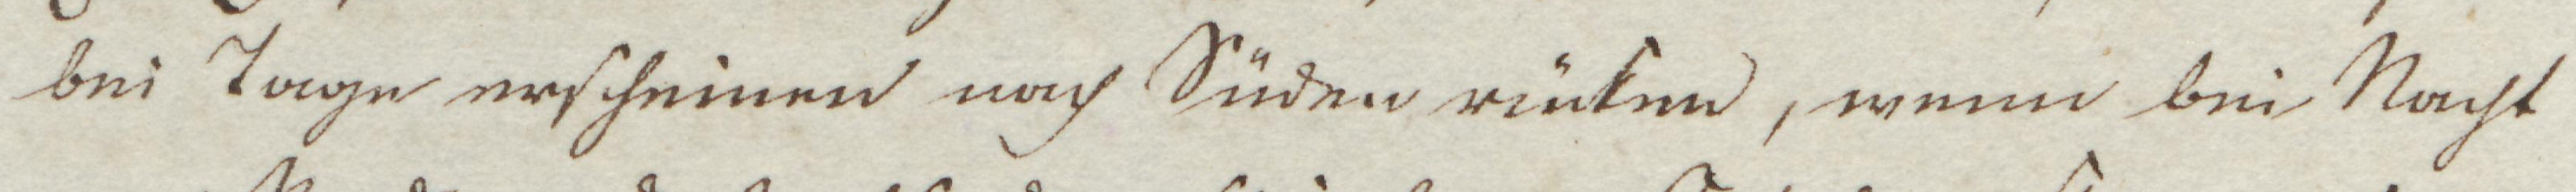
bei Tage erscheinen nach Süden rücken, wenn bei Nacht
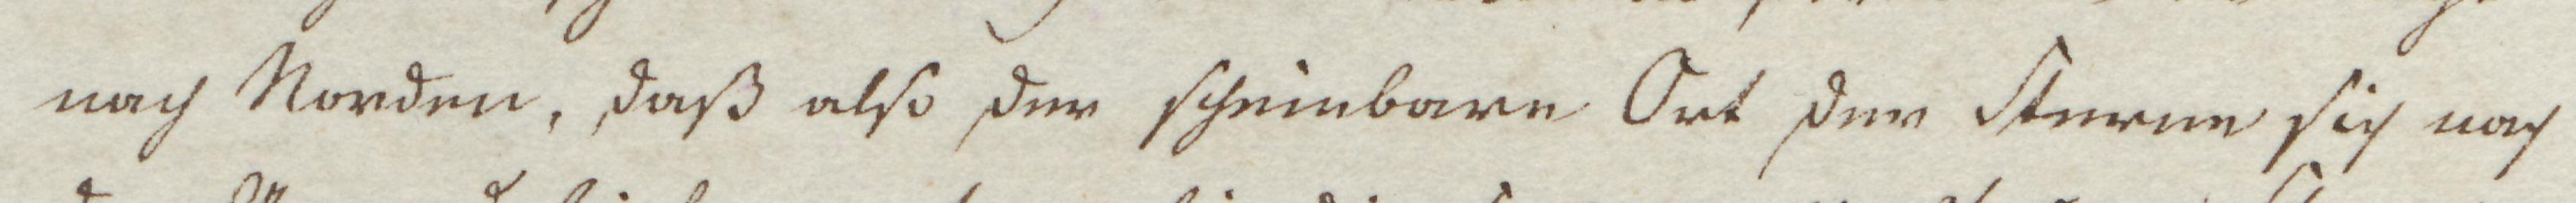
nach Norden, daß also der scheinbare Ort der Sterne sich nach
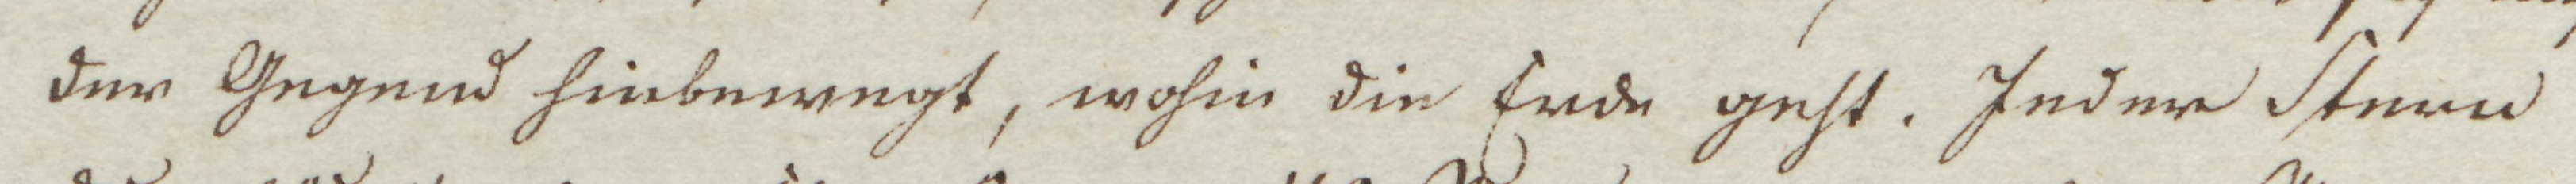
der Gegend hinbewegt, wohin die Erde geht. Jeder Stern
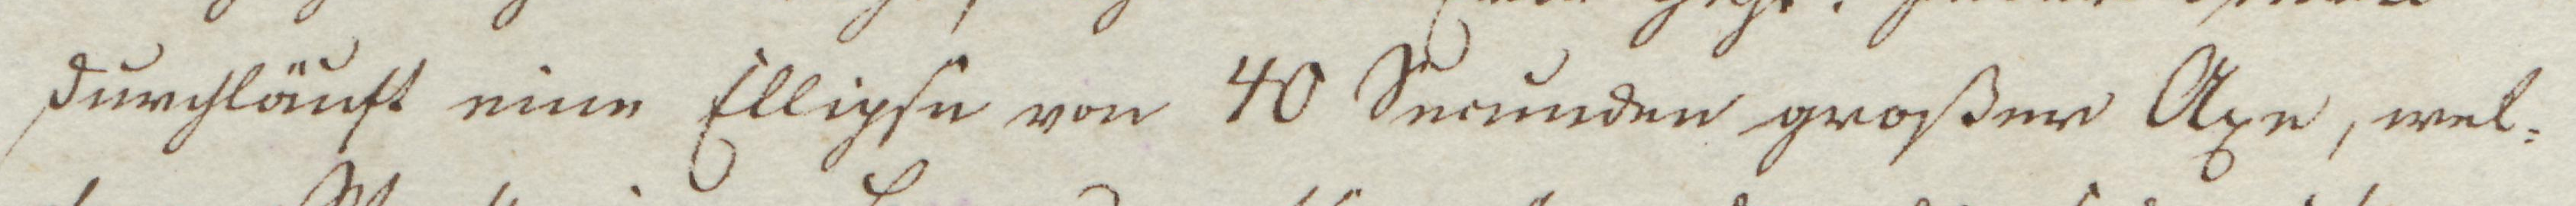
durchläuft eine Ellipse von 40 Secunden großer Axe, wel-
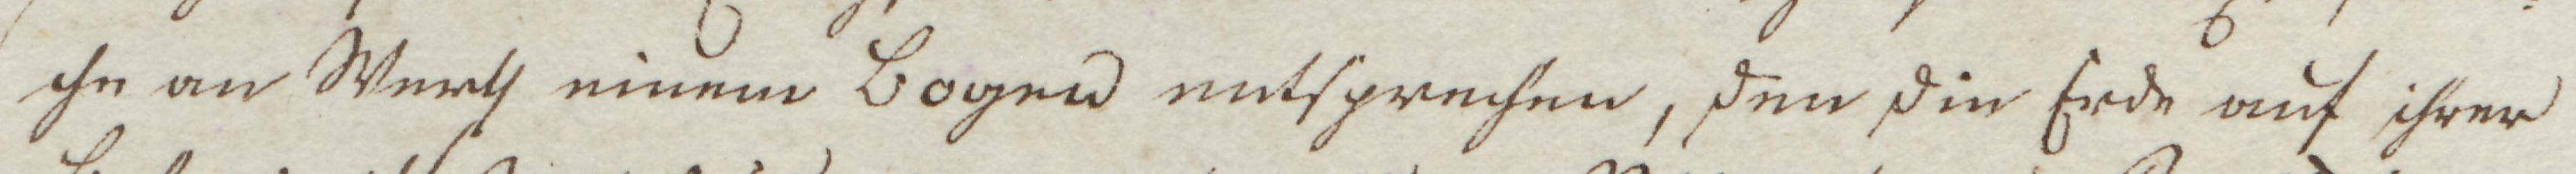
che an Werth einem Bogen entsprechen, den die Erde auf ihrer
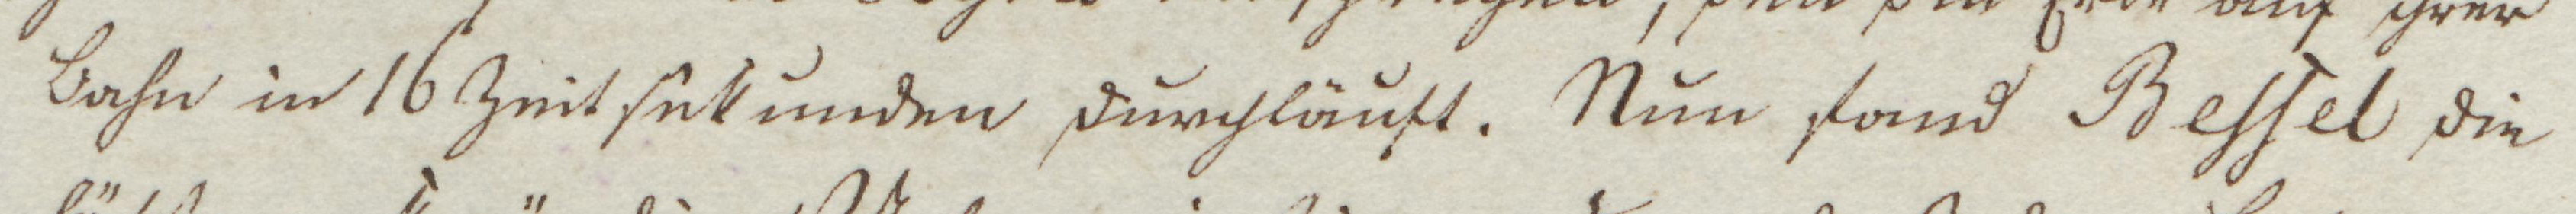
Bahn in 16 Zeitsekunden durchläuft. Nun fand Bessel die
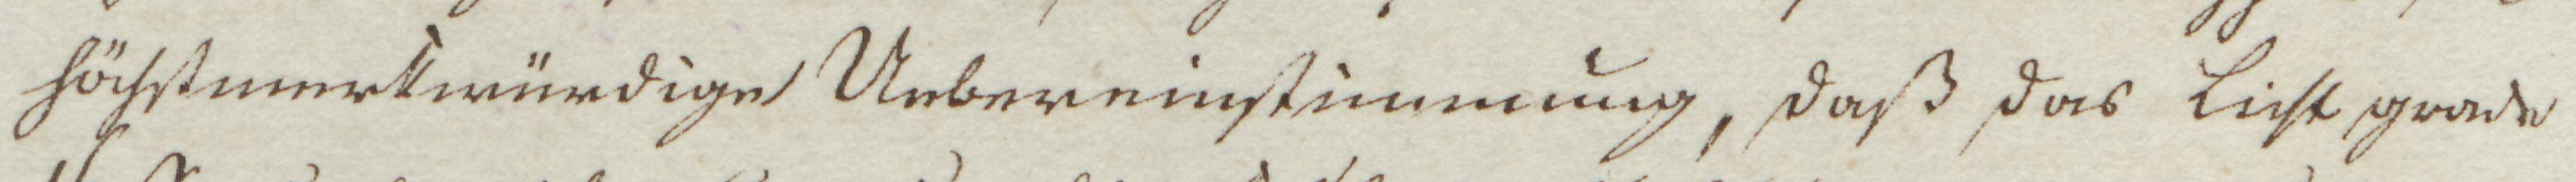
höchstmerkwürdige Uebereinstimmung, daß das Licht grade
